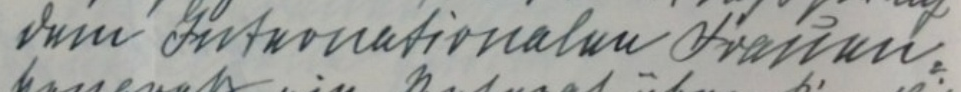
dem Internationalen Frauen
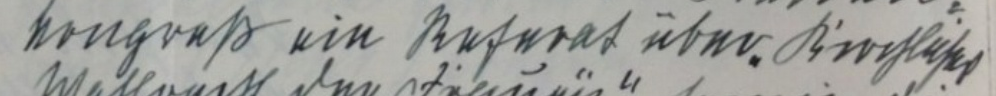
Kongreß ein Refrat über „Kirchliches
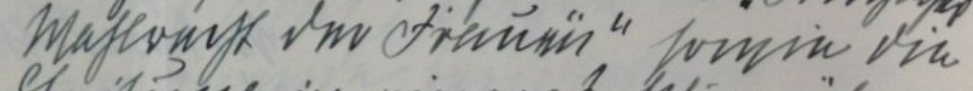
Wahlrecht der Frauen" sowie die
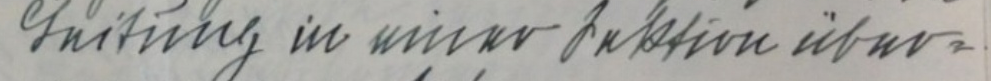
Leitung einer Sektion über-
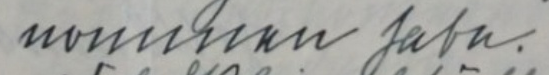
nommen habe.
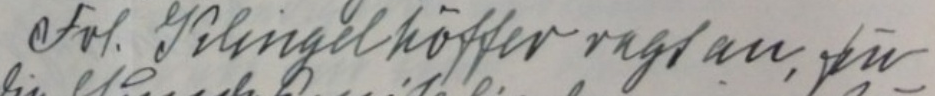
Frl. Klingelhöffer regt an, für
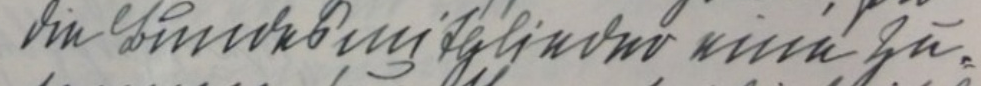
die Bundesmitglieder eine Zu
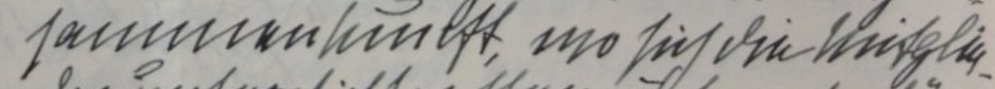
sammenkunft, wo sich die Mitglie
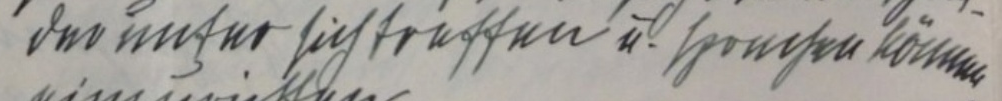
der unter sich treffen u. sprechen können
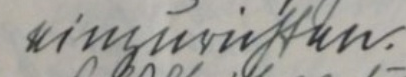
einzurichten.
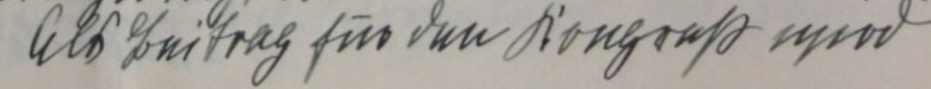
Als Beitrag für den Kongreß wird
